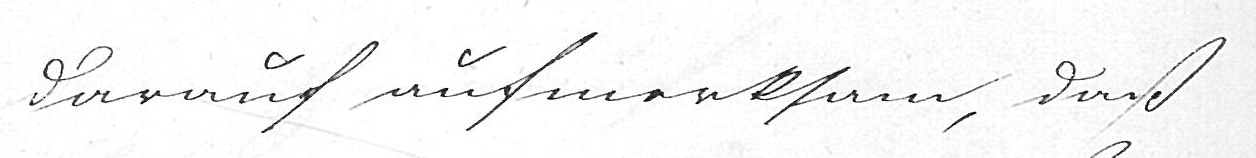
darauf aufmerksam daß
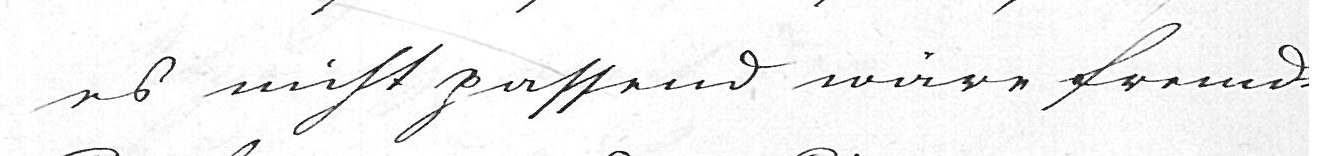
es nicht passend wäre fremde
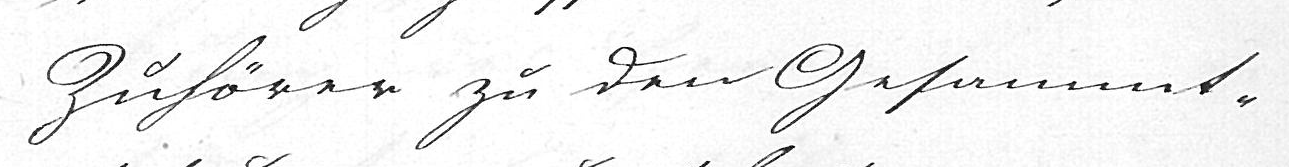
Zuhörer zu den Gesammt-
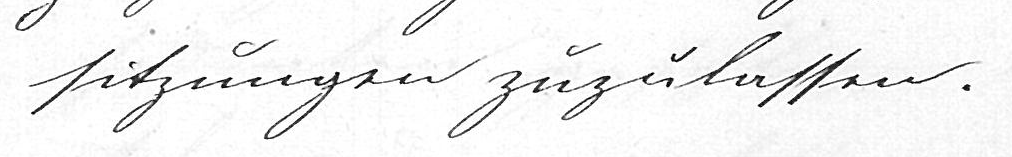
sitzungen zuzulassen.
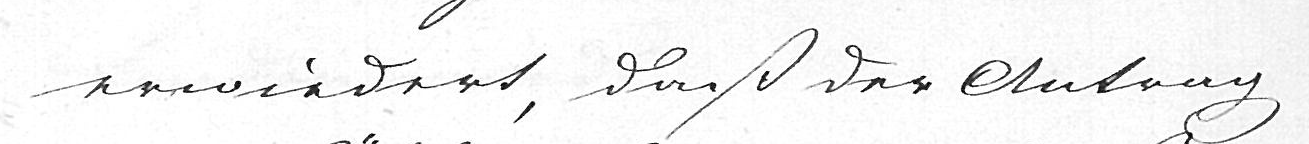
erwiedert, daß der Antrag
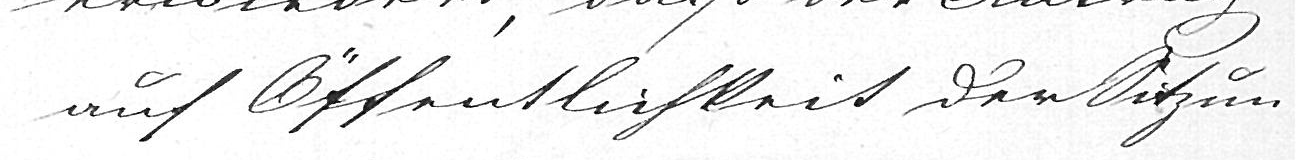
auf Öffentlichkeit der Sitzun-
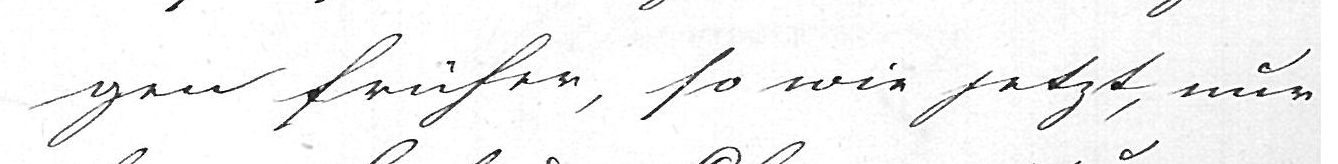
gen früher, so wie jetzt, nur
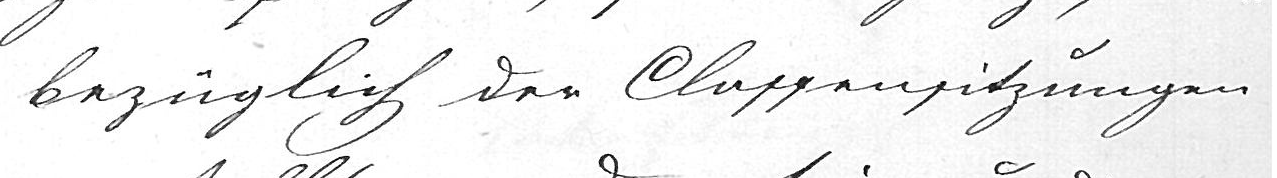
bezüglich der Classensitzungen
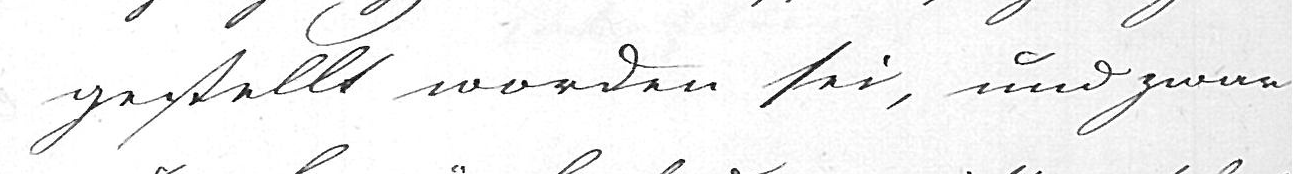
gestellt worden sei, und zwar
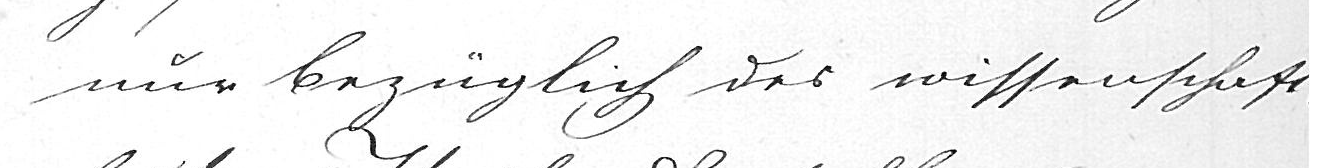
nur bezüglich des wissenschaft-
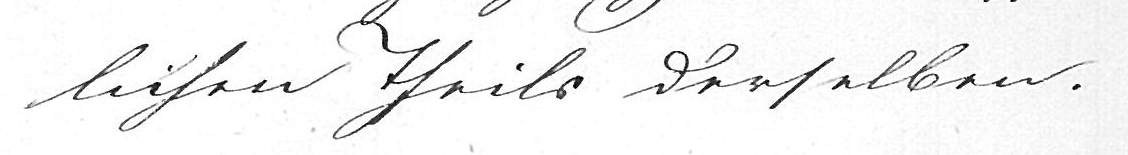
lichen Theils derselben.
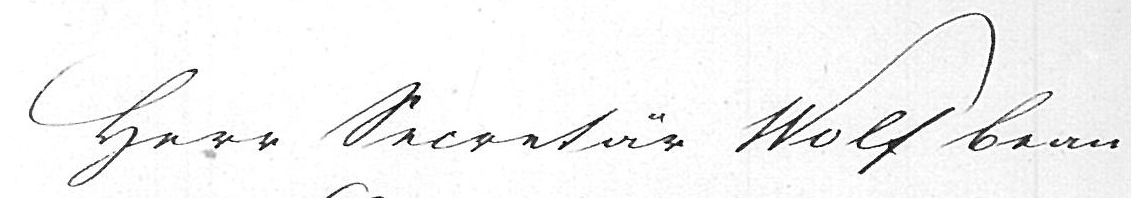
Herr Secretär Wolf bean-
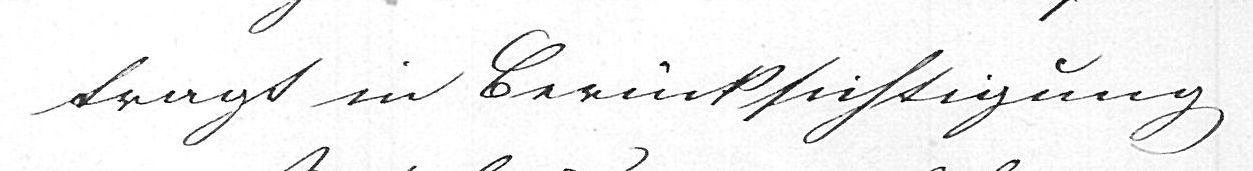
tragt in Berücksichtigung
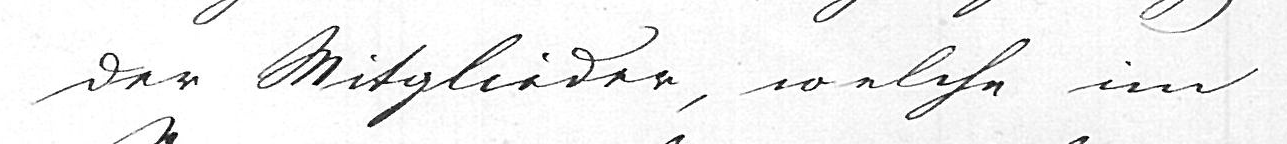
der Mitglieder, welche i,
